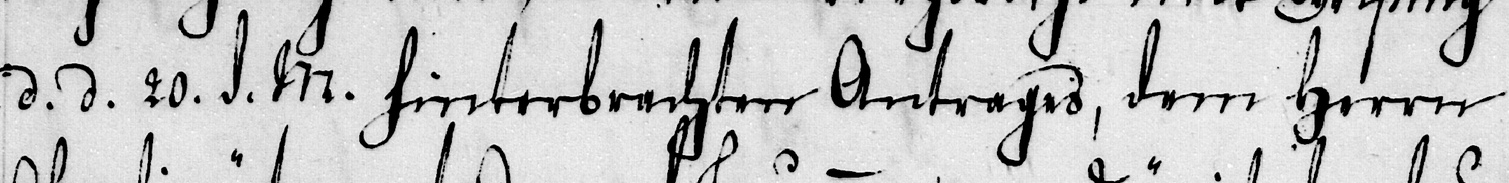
d. d. 20. d. M. hinterbrachten Antrages, dem Herrn
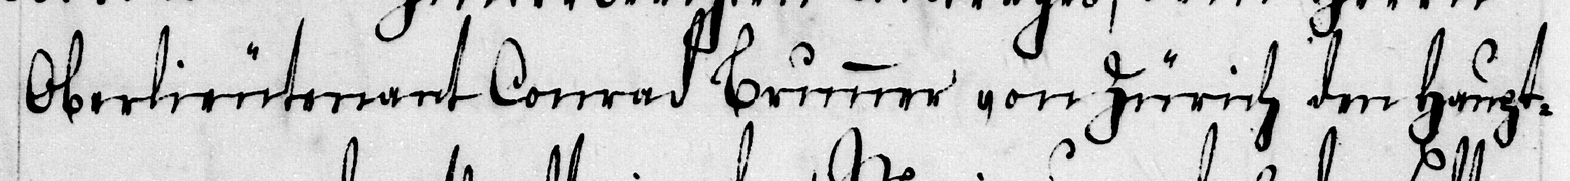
Oberlieutenant Conrad Brunner von Zürich den Haupt¬
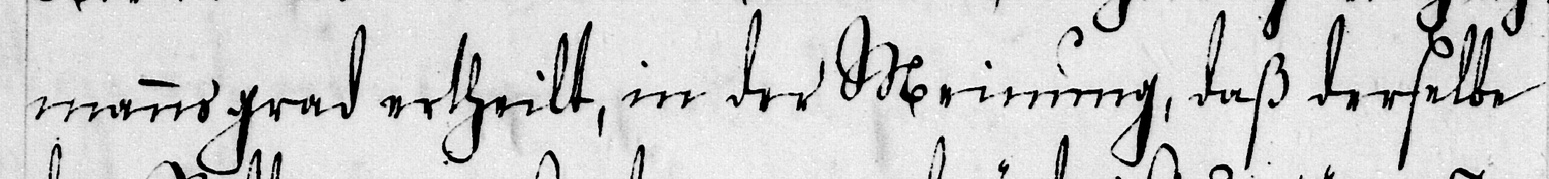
mannsgrad ertheilt, in der Meinung, daß derselbe
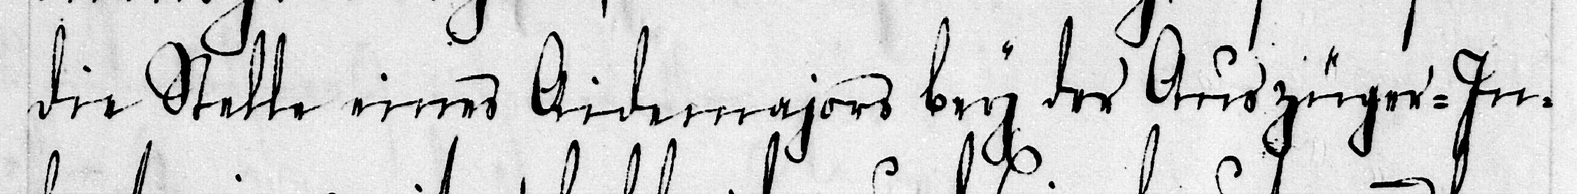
die Stelle eines Aidemajors bey der Auszüger-In¬
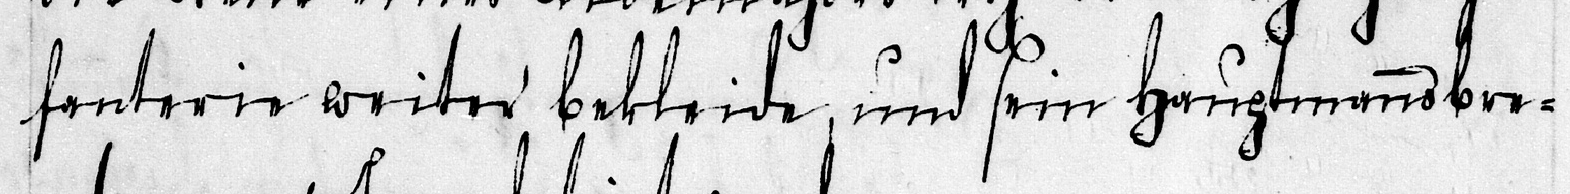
fanterie weiter bekleide, und sein Hauptamannsbre¬
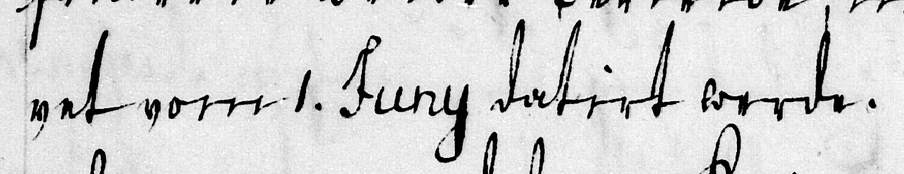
vet vom 1. Juny datirt werde.
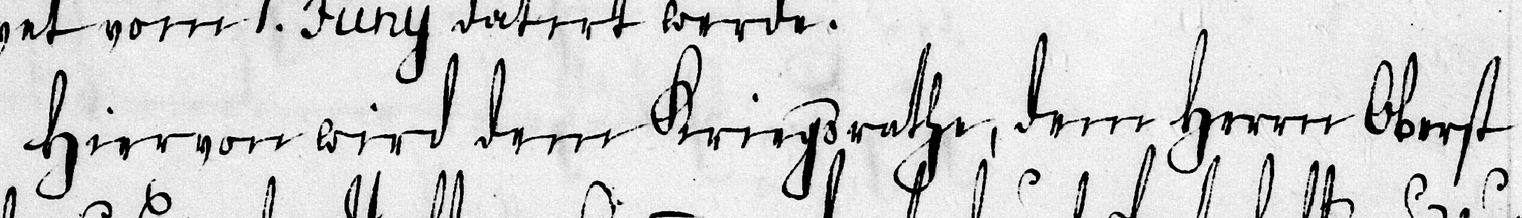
Hiervon wird dem Kriegsrathe, dem Herrn Oberst
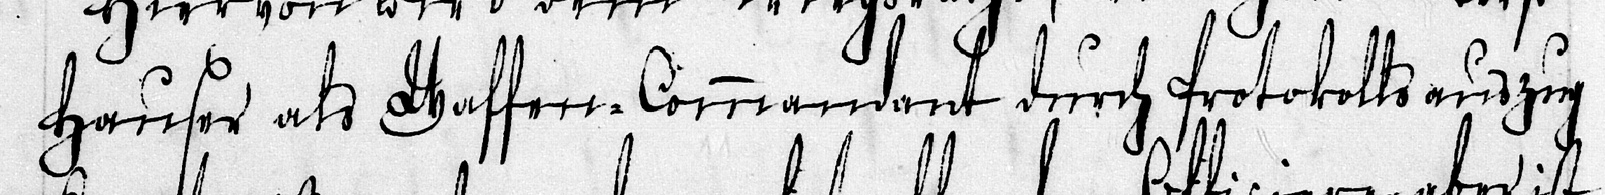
Hauser als Waffen-Commandant durch Protokollsauszug
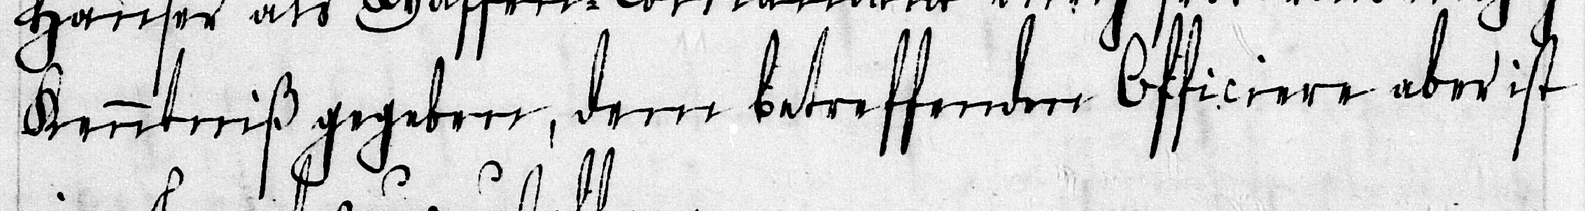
Kenntniß gegeben, dem betreffenden Officiere aber ist
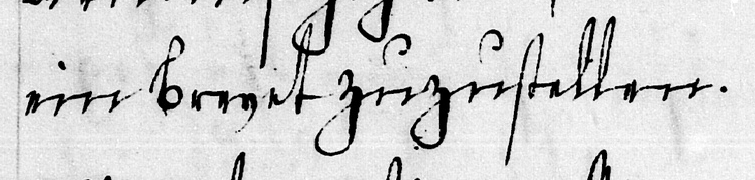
ein Brevet zuzustellen.
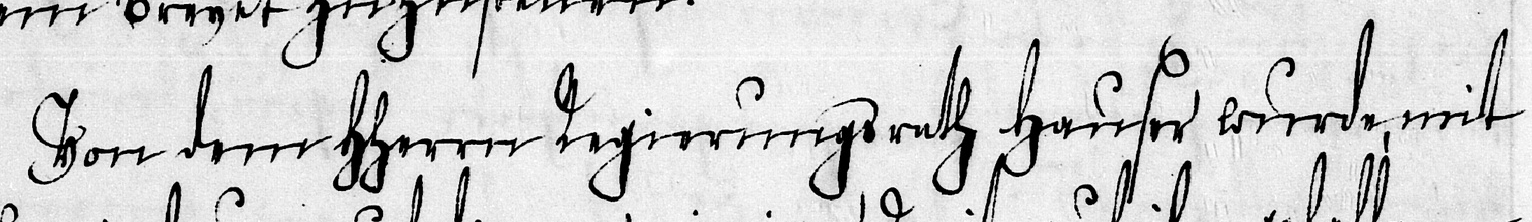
Von dem HHerrn Regierungsrath Hauser wurde, mit
